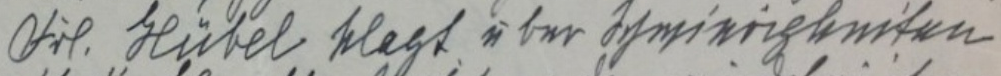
Frl. Hübel klagt über Schwierigkeiten
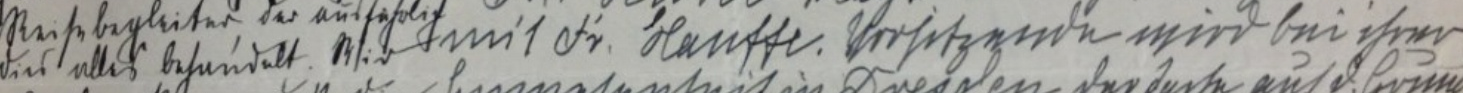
mit Fr. Hauffe. Vorsitzende wird bei ihrer
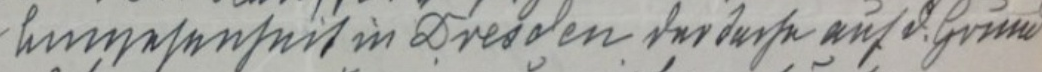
Anwesenheit in Dresden der Sache auf d. Grund
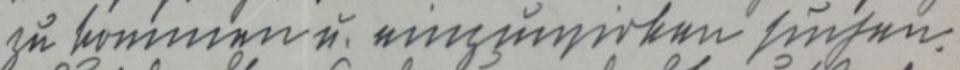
zu kommen u. einzuwirken suchen.
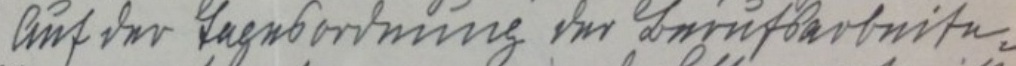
Auf der Tagesordnung der Berufarbeite
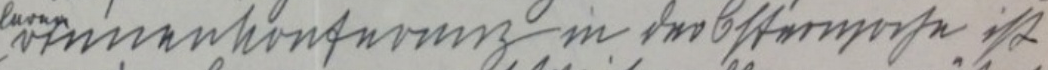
rinnenkonferenz in der Osterwich ist
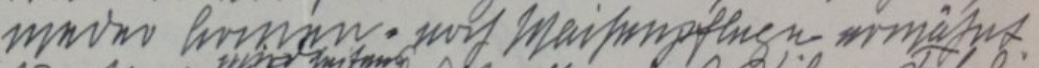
weder Armen- noch Waisenpflege erwähnt.
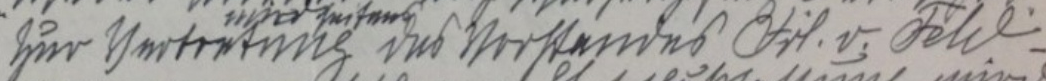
Zur Vertretung wird seitens des Vorstandes Frl. v. Fehl
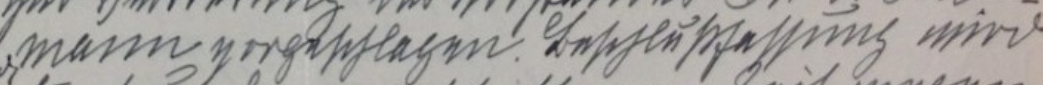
mann vorgeschlagen. Beschlußfassung wird
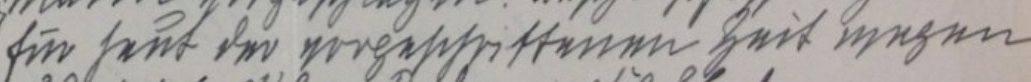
für heut der vorgeschrittenen Zeit wegen
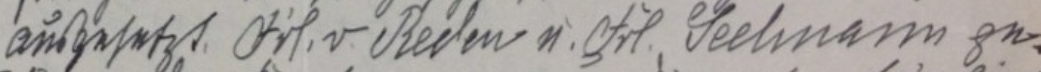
ausgesetzt. Frl. v. Reden u. Frl. Seelmann ge
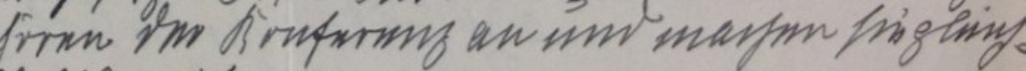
hören der Konferenz an und machen sie gkeich
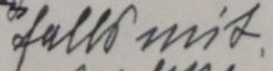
falls mit.
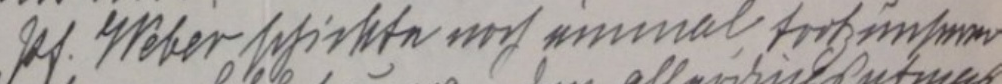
Pf. Weber schickte noch einmal trotz unserer
